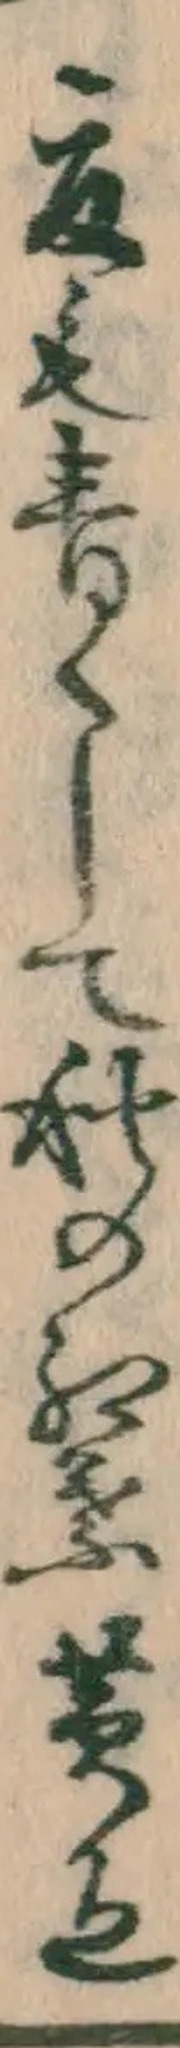夏も青くして秋の紅葉黄色
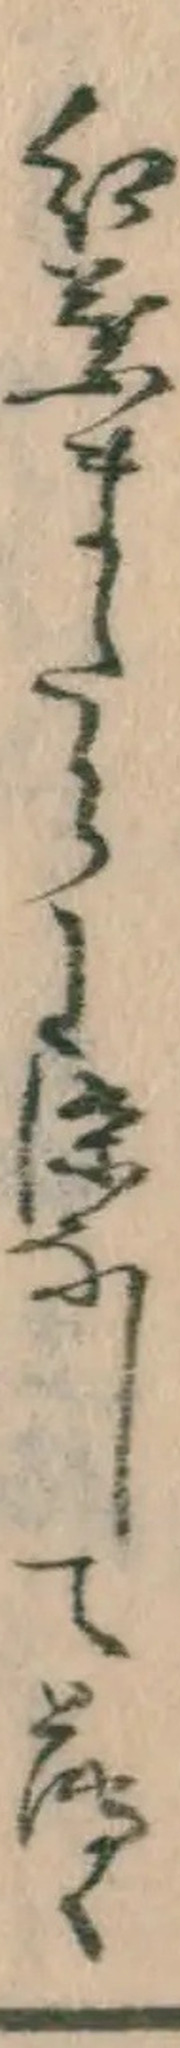紅葉またらに染なして薄く
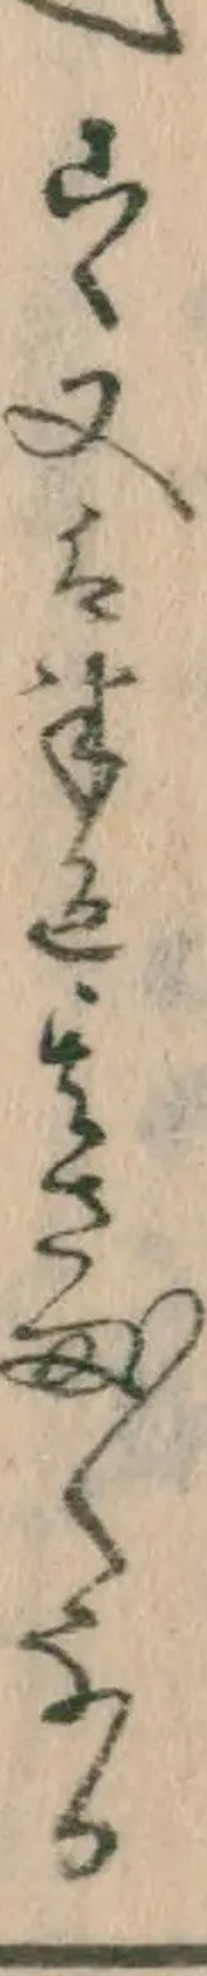こく又は半色其さま〳〵なる
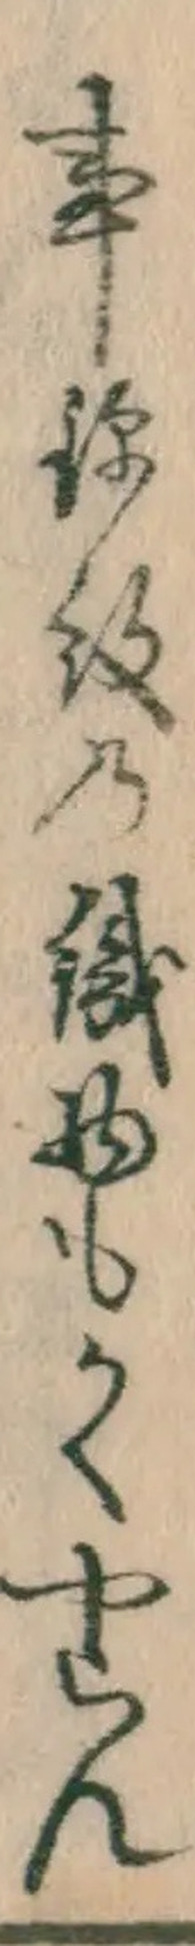事錦紋の織物もかくやらん
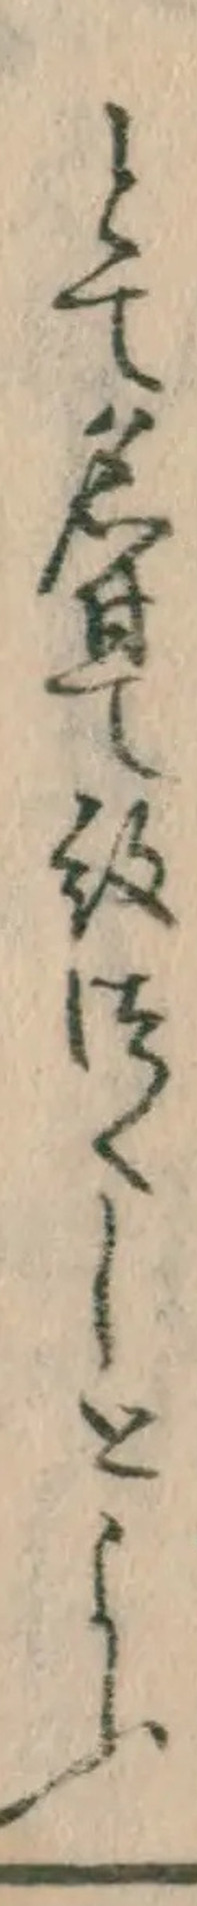とて名付て紋つくしとよふ
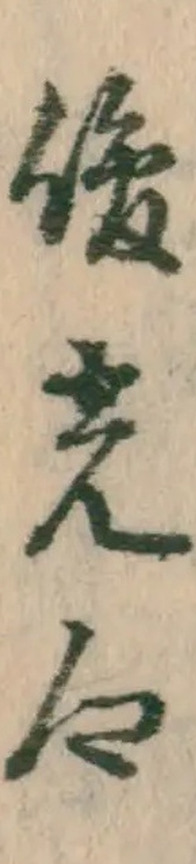後光卿
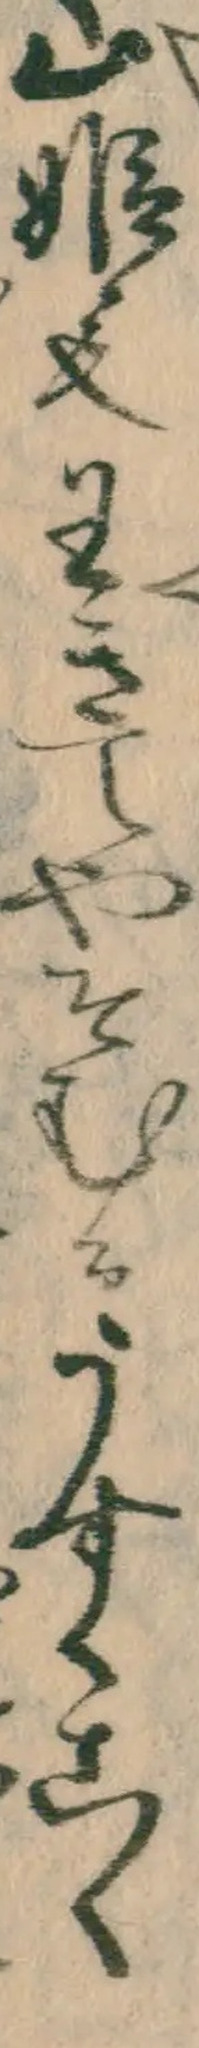山姫もわきてやそむるうすくこく
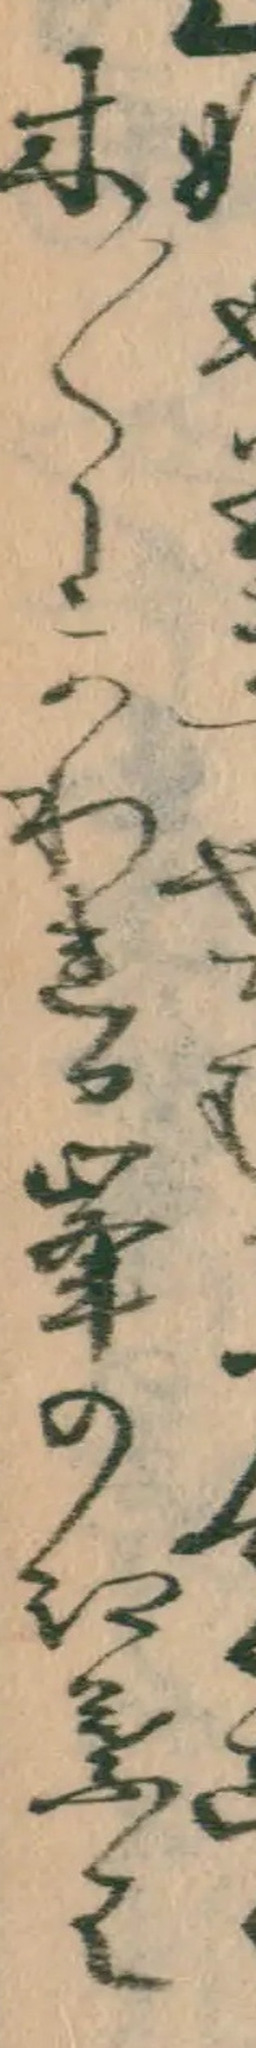木〳〵にかわれる峯の紅葉は

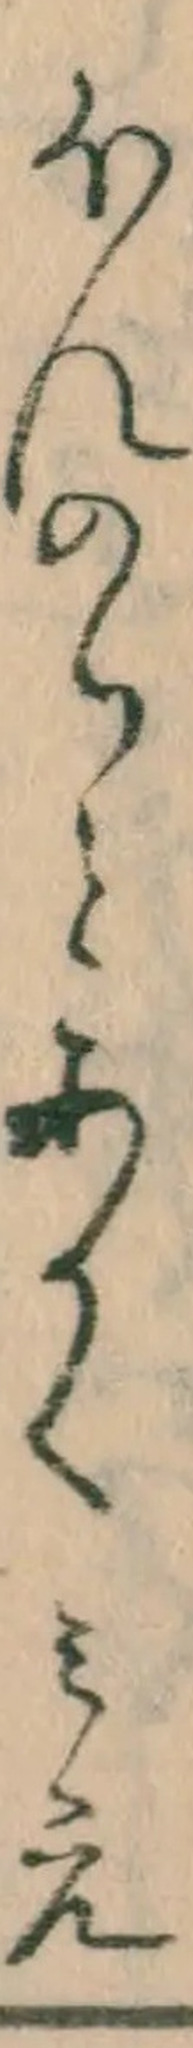ほんのりとあかくみえ
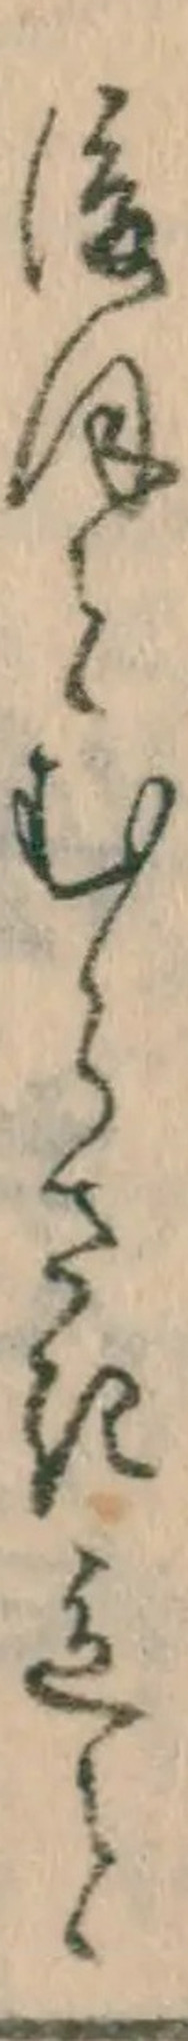後ほとむらさき色と
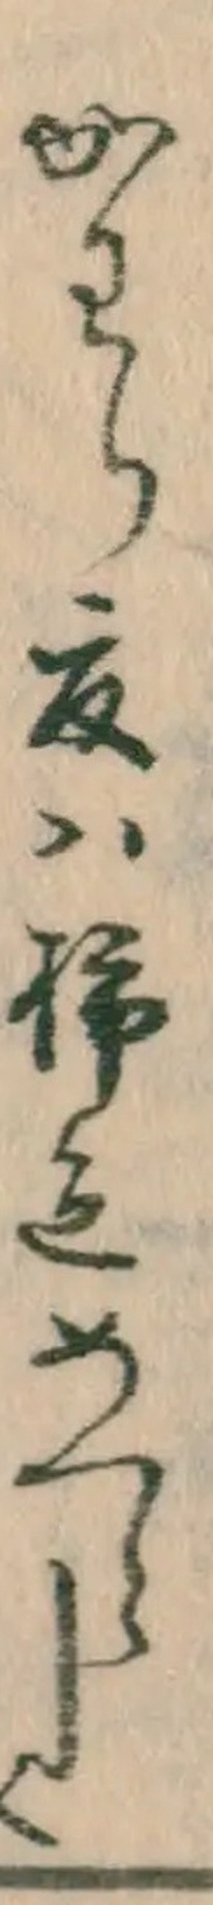かわり夏は柿色めつらしく
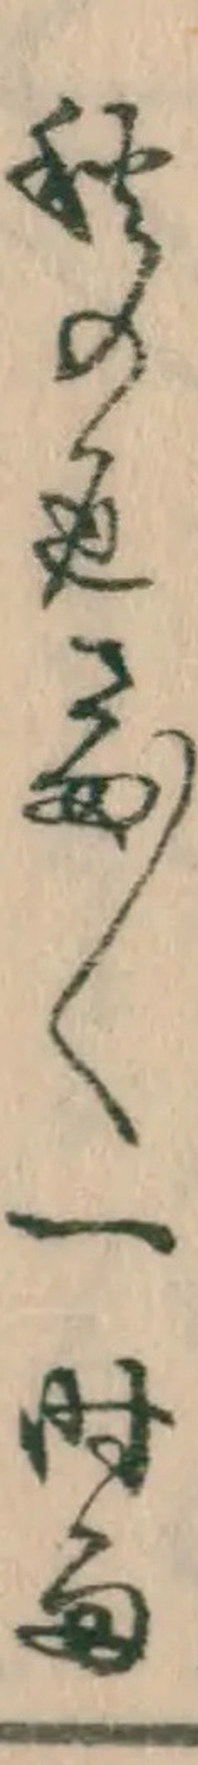秋の色さま〳〵一時雨
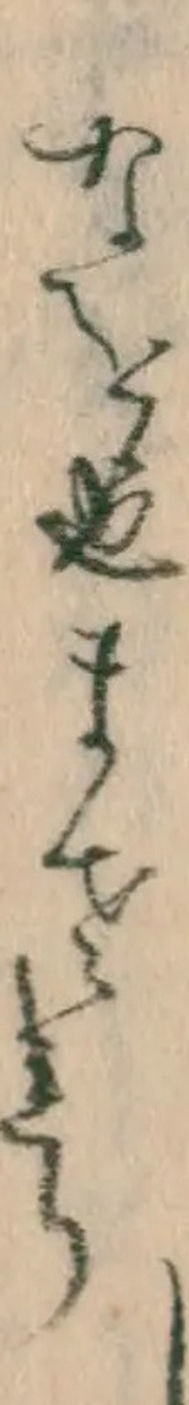なを色まされり
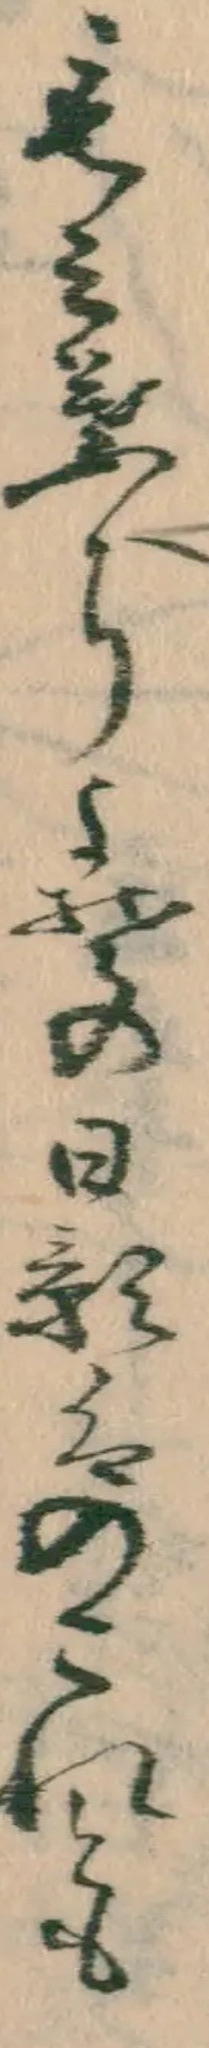もみ葉によその日影はのこれとも
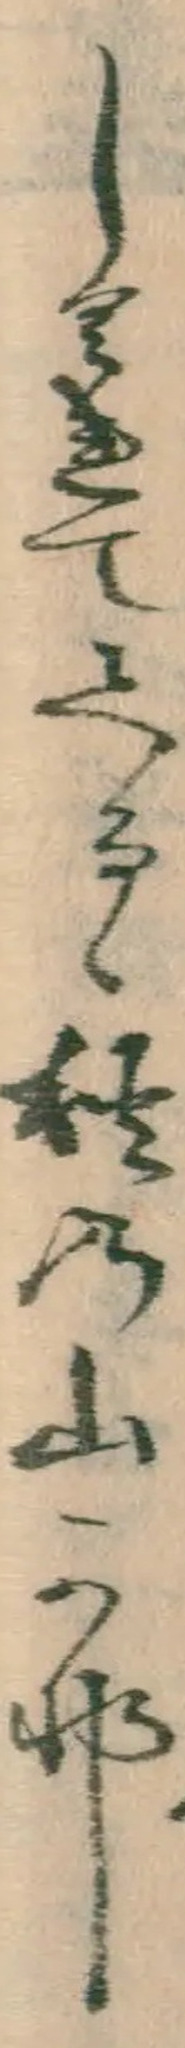しくれてくるゝ秋の山かな
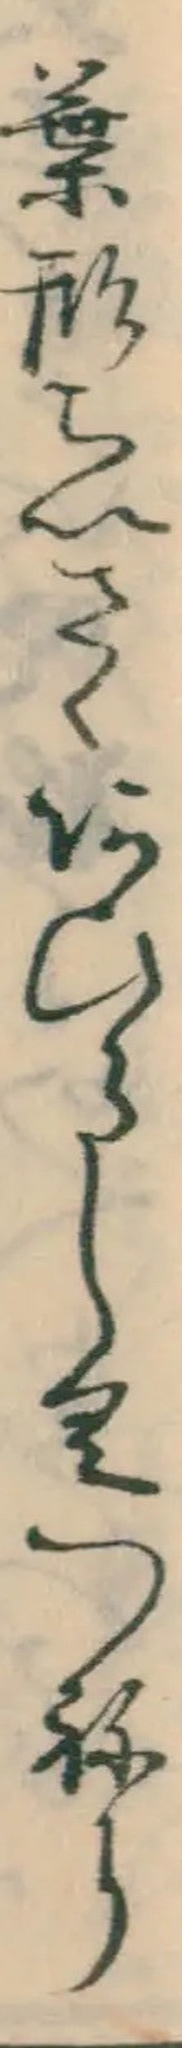鬱金葉形ちいさくあひらしくつねに
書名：紅葉集
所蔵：国立国会図書館 National Diet Library, JAPAN
